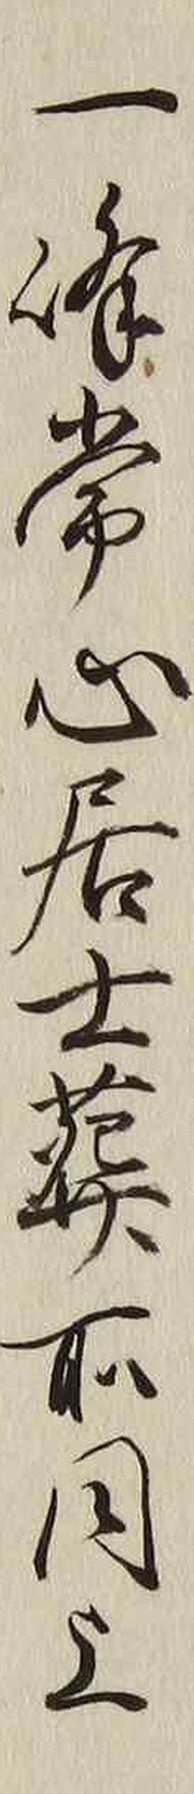一峰常心居士葬所同上
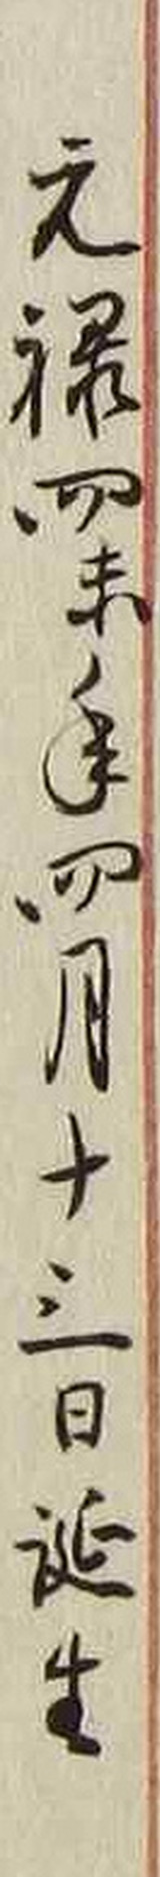元禄四未年四月十三日誕生
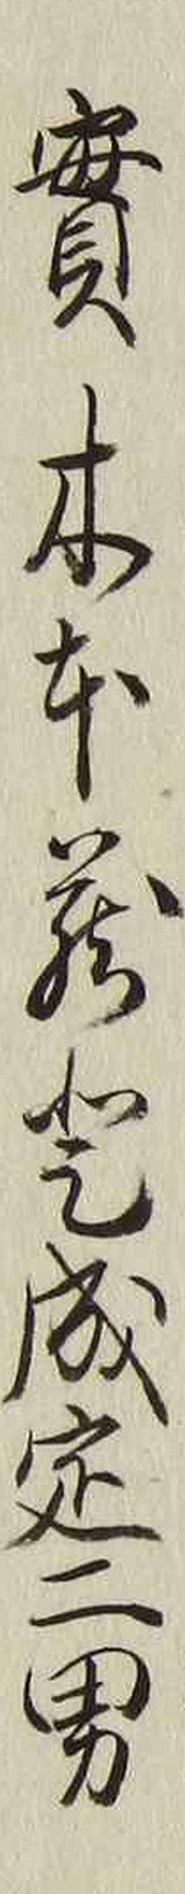実木本蔵登成定二男
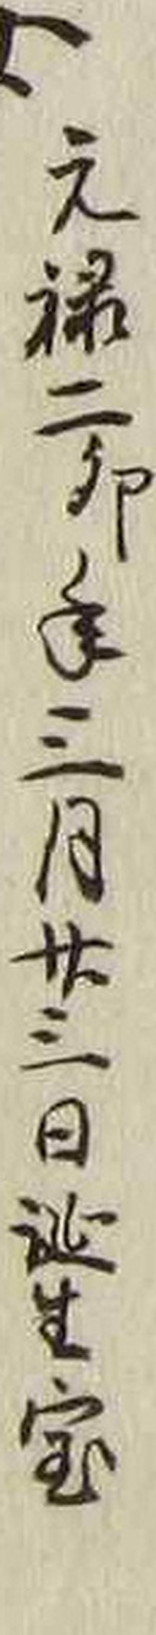元禄四未年四月十三日誕生
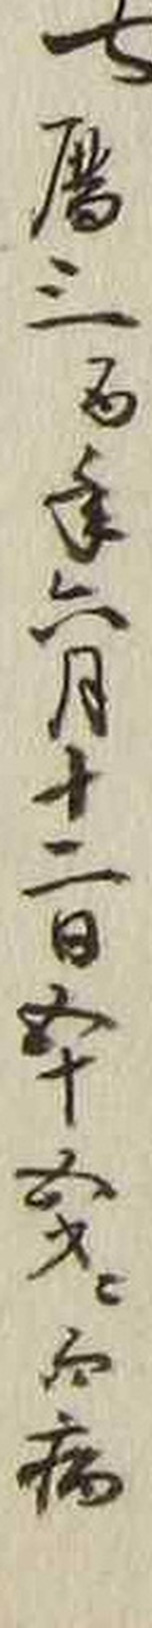暦三酉年六月十二日五十五才ニ而病
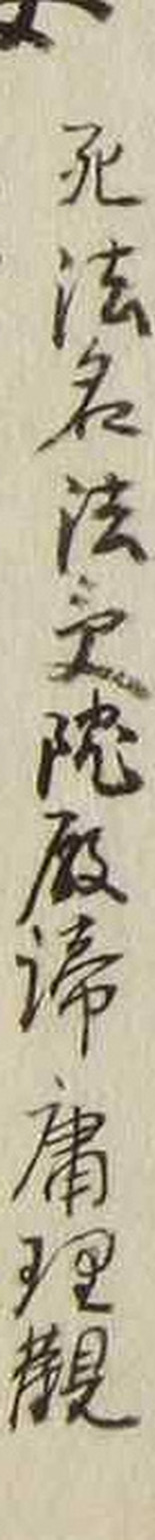死法名法受院殿諦庸理観
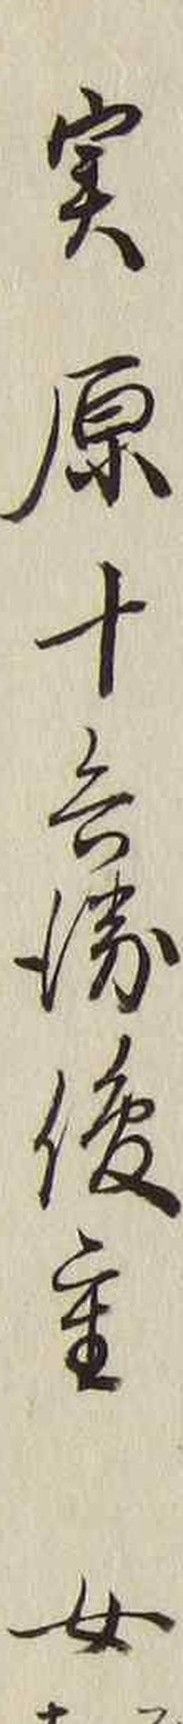実原十兵衛俊重女
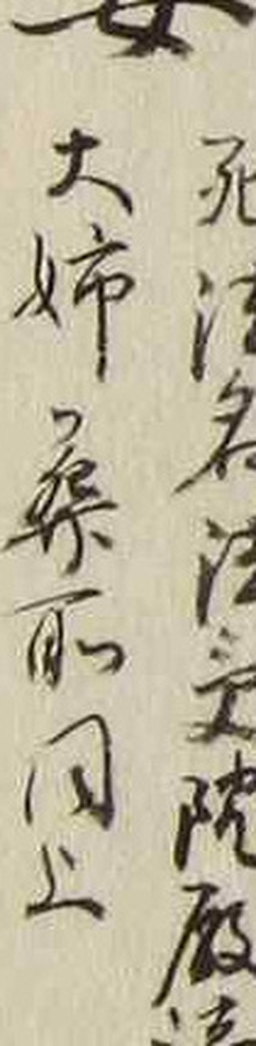大姉葬所同上

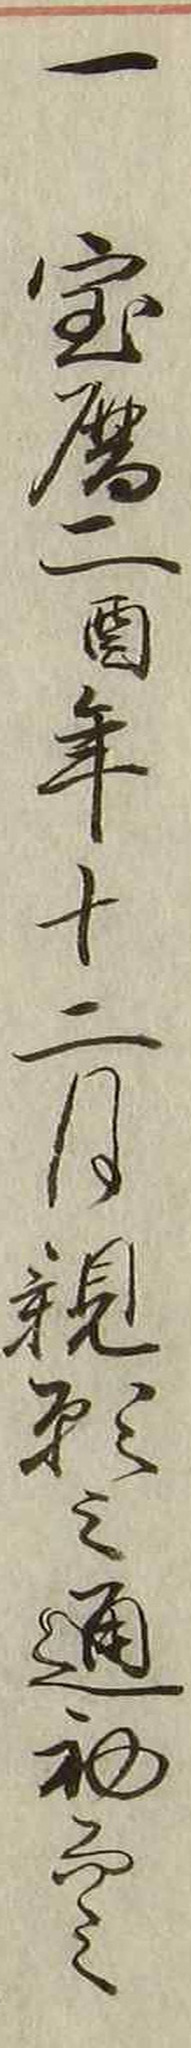一宝暦二酉年十二月親願之通初而之
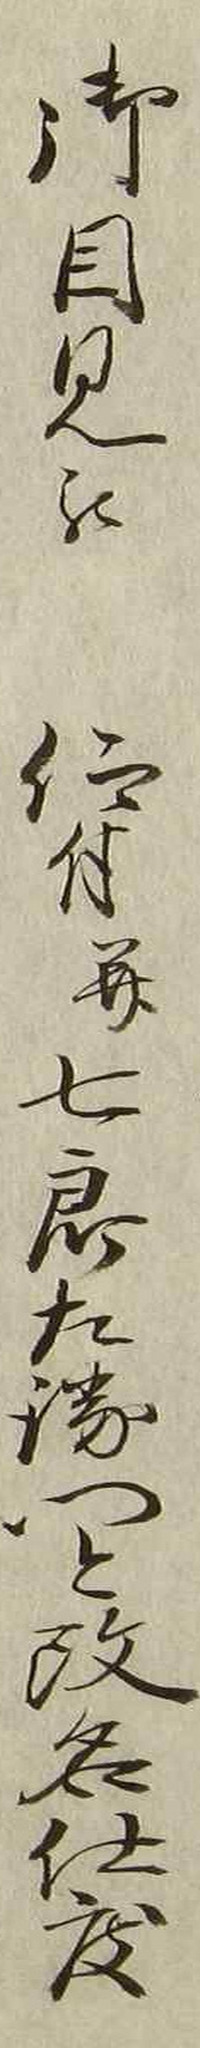御目見被仰付并七郎左衛門と改名仕度
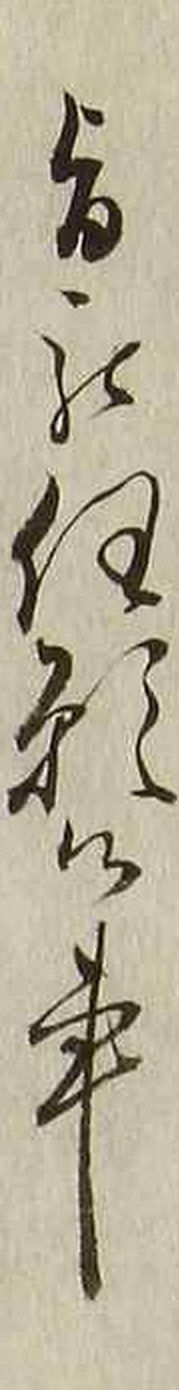旨被任願候事
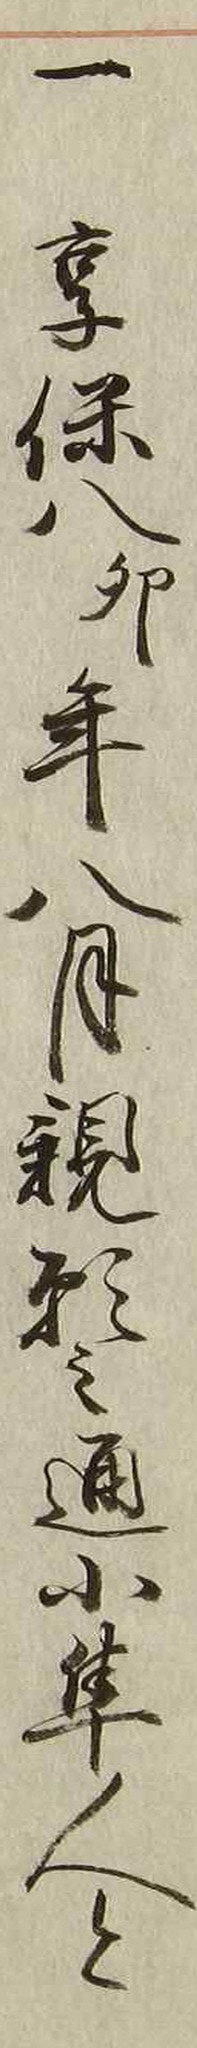一享保八卯年八月親願之通小隼人と
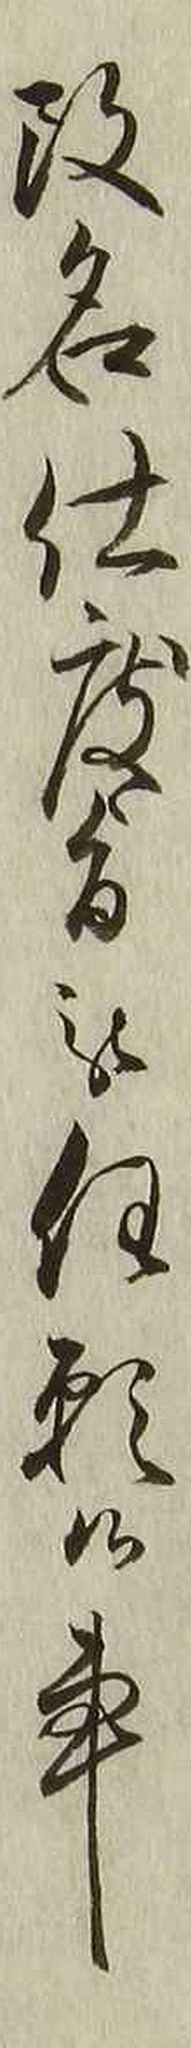改名仕度旨被任願候事
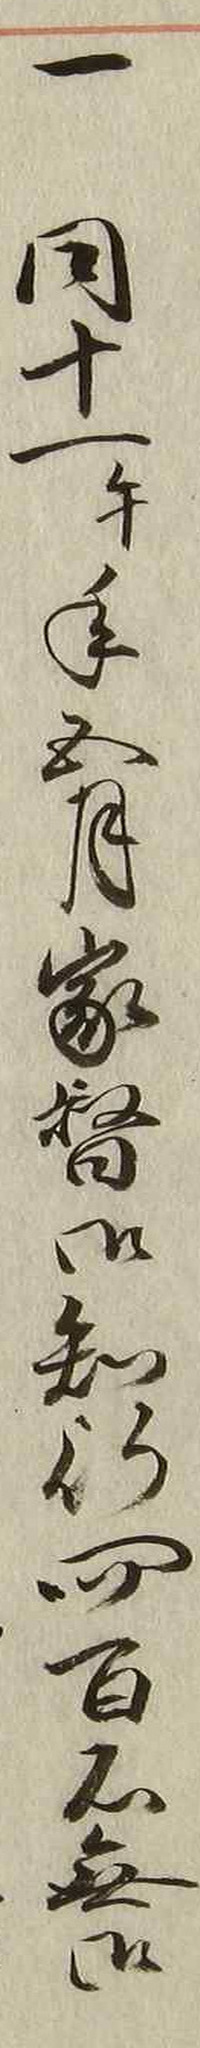一同十一午年五月家督御知行四百石無御
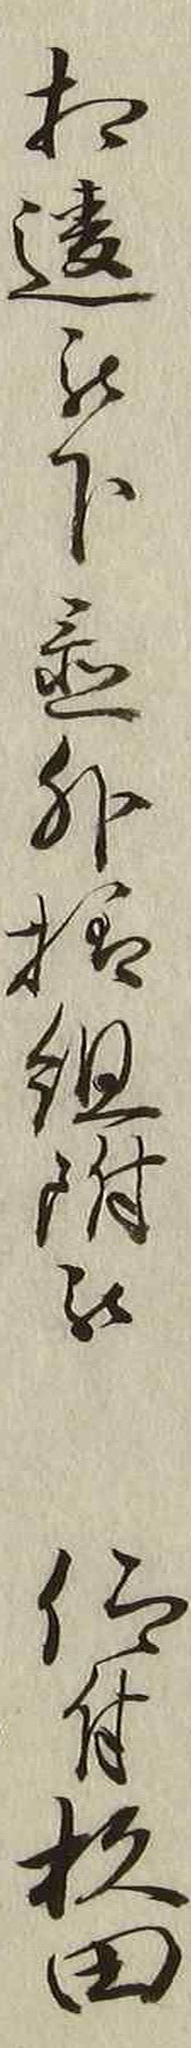相違被下置外様組付被仰付杉田
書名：諸士系譜　巻之21　い之部21
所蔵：会津若松市立会津図書館
